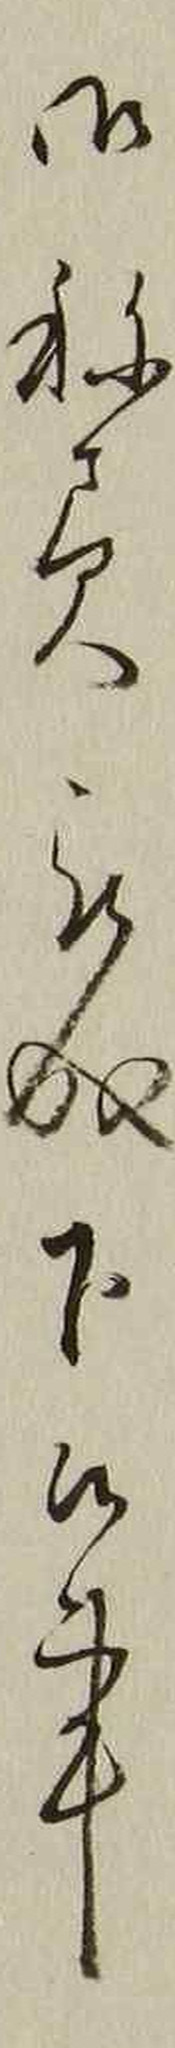御称美被成下候事
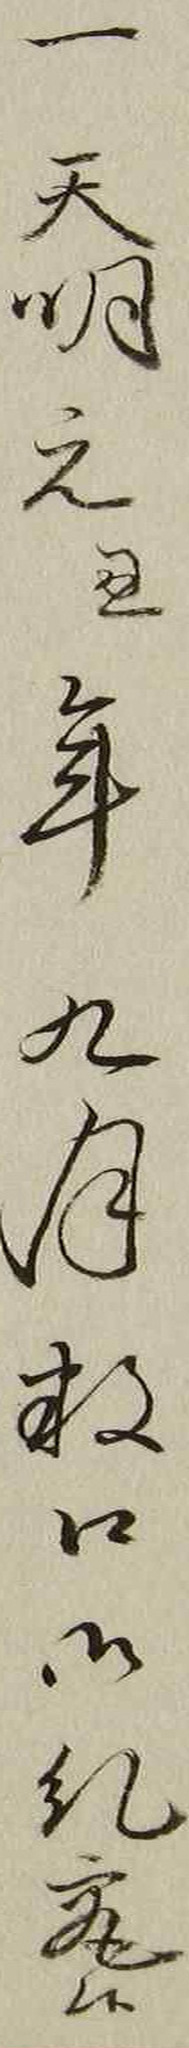一天明元丑年九月数口御糺究候
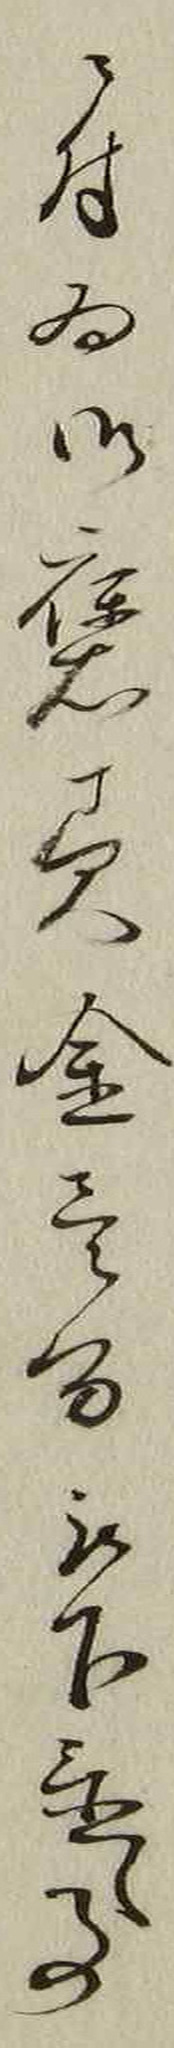ニ付為御褒美金壱分被下置候事
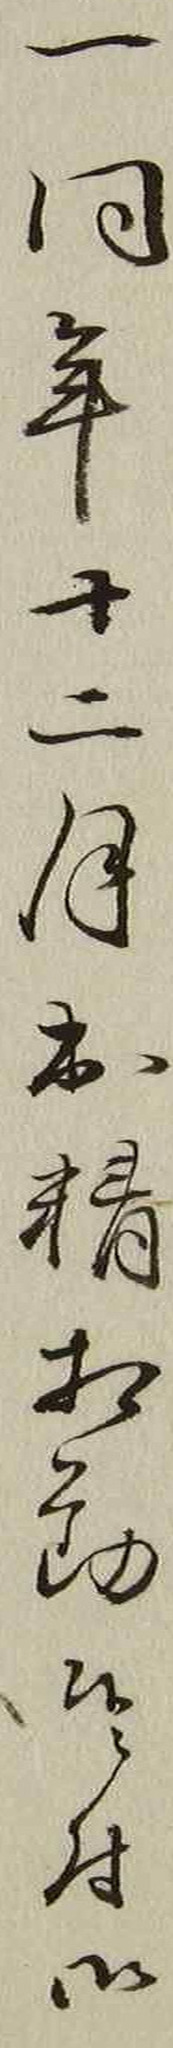一同年十二月出精相勤候ニ付御
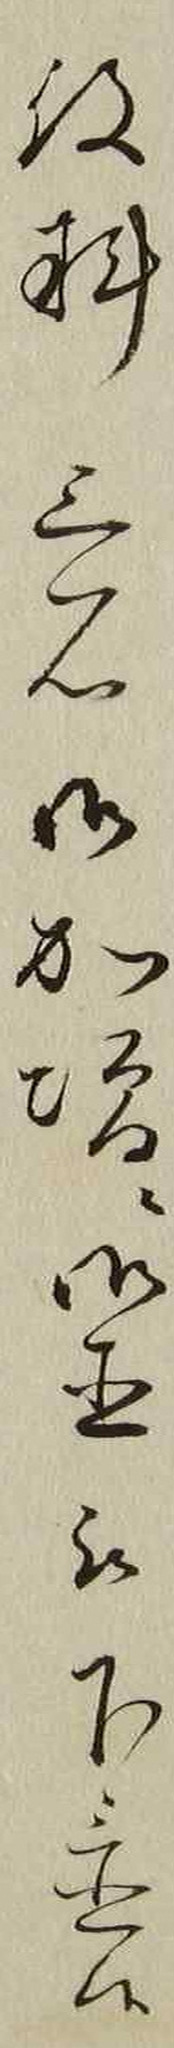役料三石御加増ニ御直被下置候
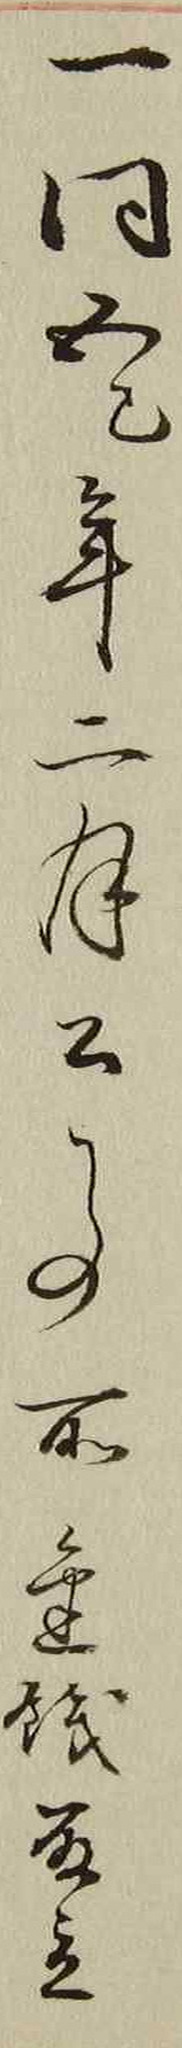一同五巳年二月公事所金銭取立
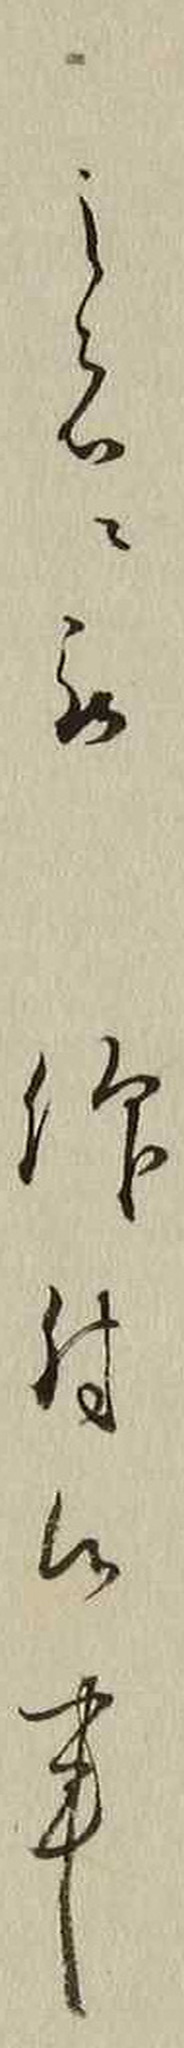之者ニ被仰付候事
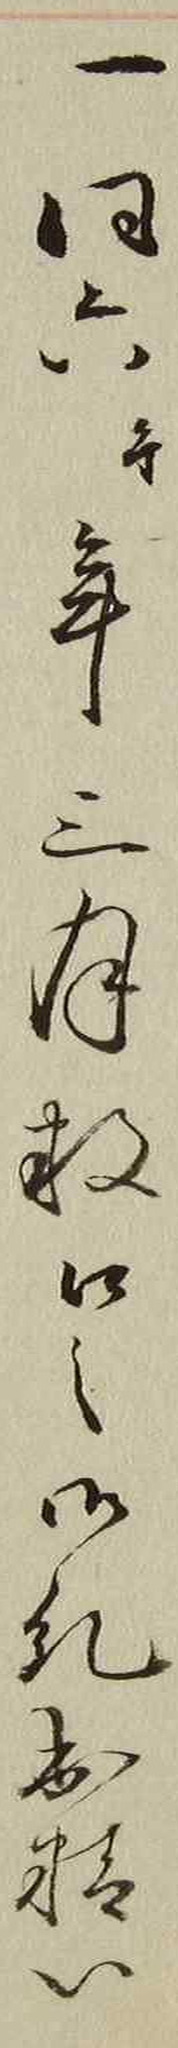一同六午年三月数口之御糺出情い
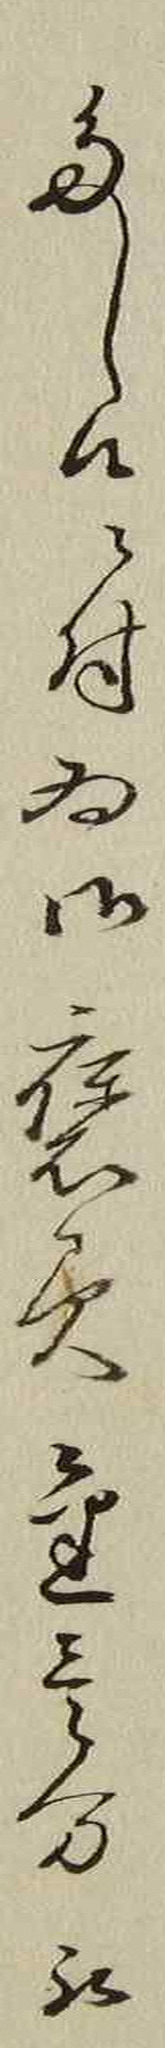たし候ニ付為御褒美金壱分被
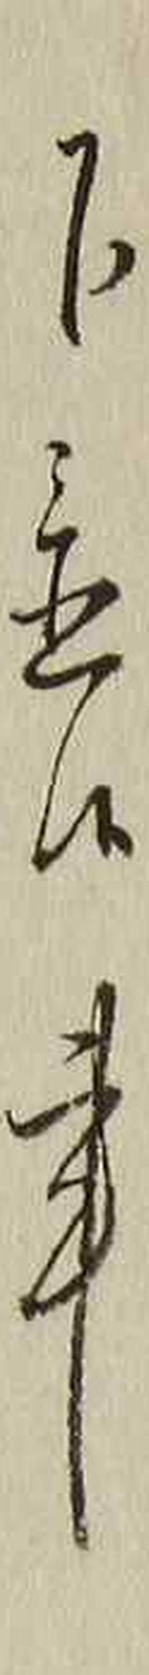下置候事
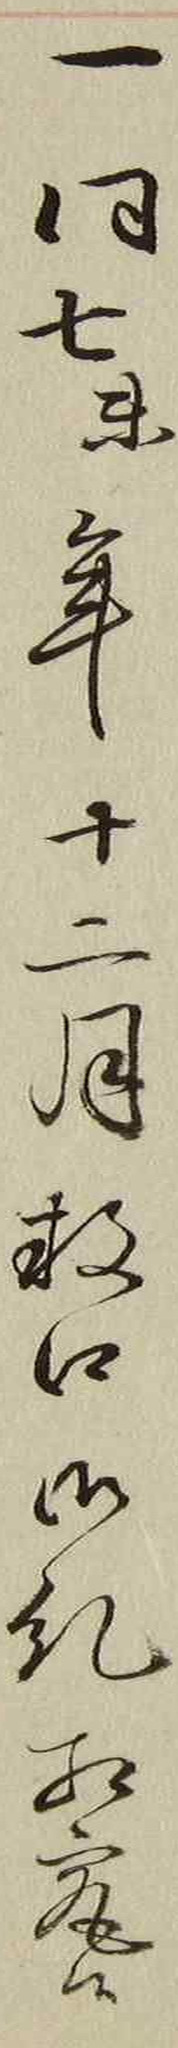一同七未年十二月数口御糺相究候
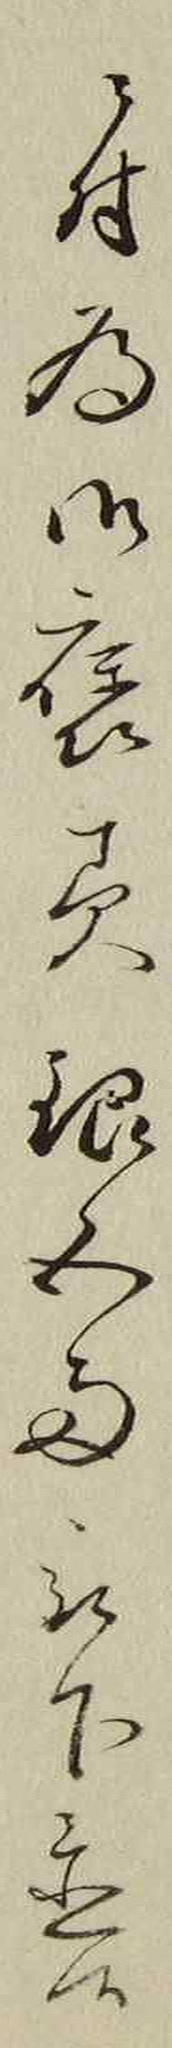ニ付為御褒美銀五両被下置候
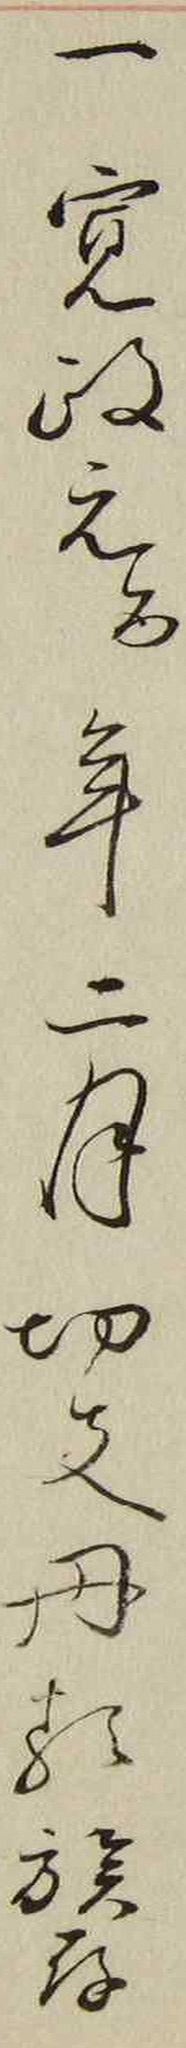一寛政元酉年二月切支丹類族存
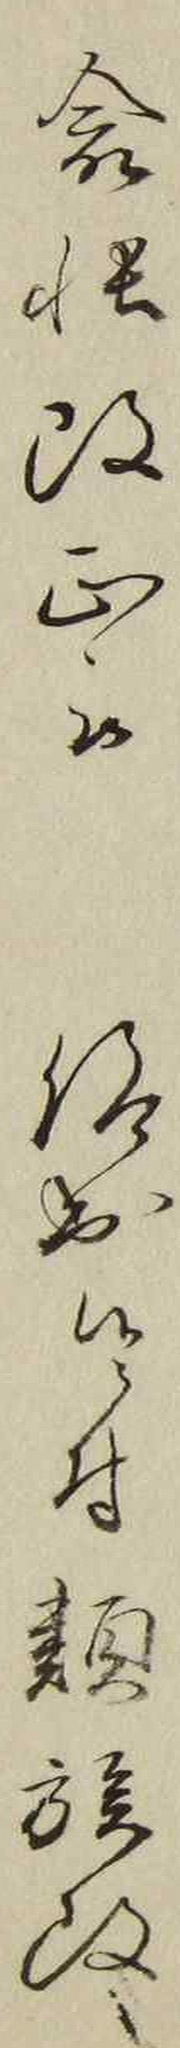命帳改正被仰出候ニ付類族改之

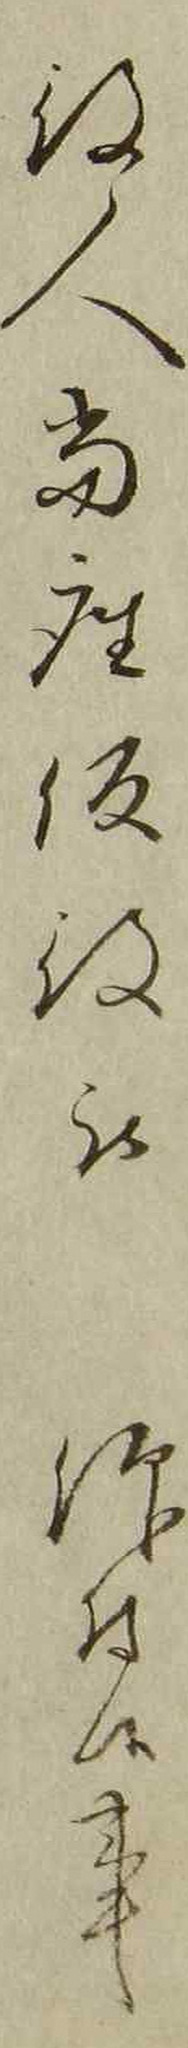役人当座仮役被仰付候事
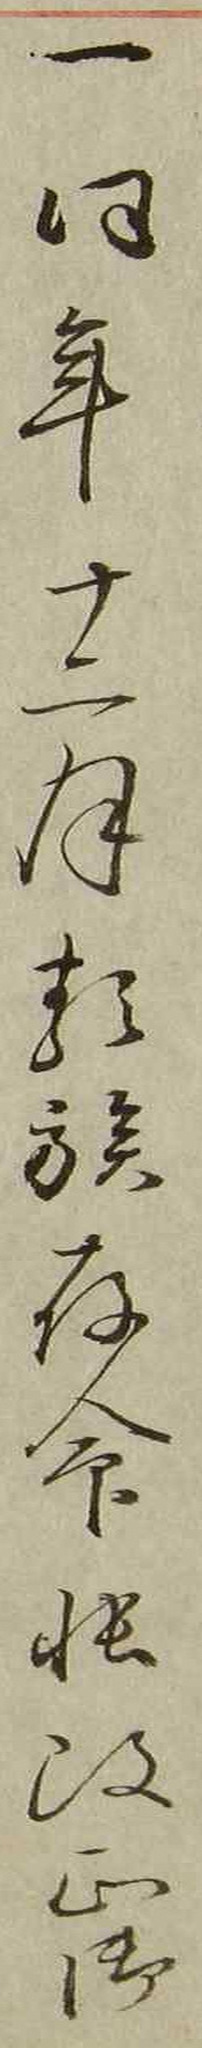一同年十二月類族存命帳改正御
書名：諸士系譜　巻之8　い之部8
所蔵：会津若松市立会津図書館
